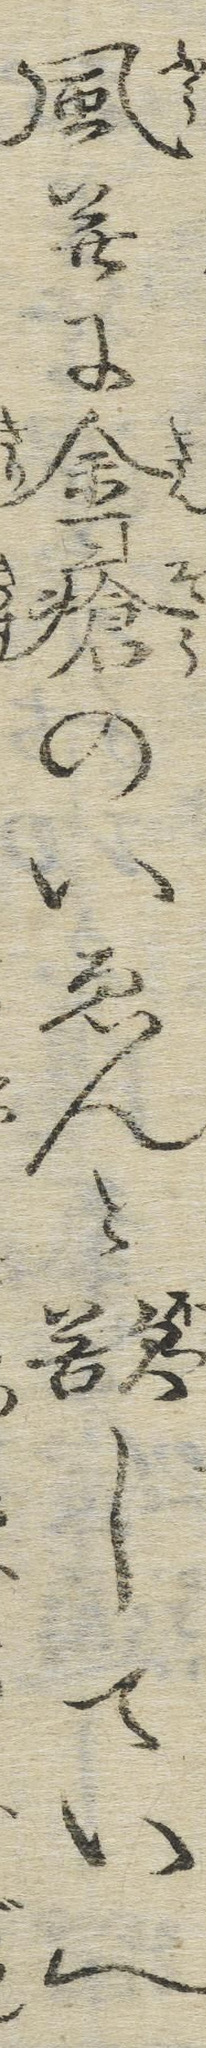風并に金瘡のいゑんと欲していへ
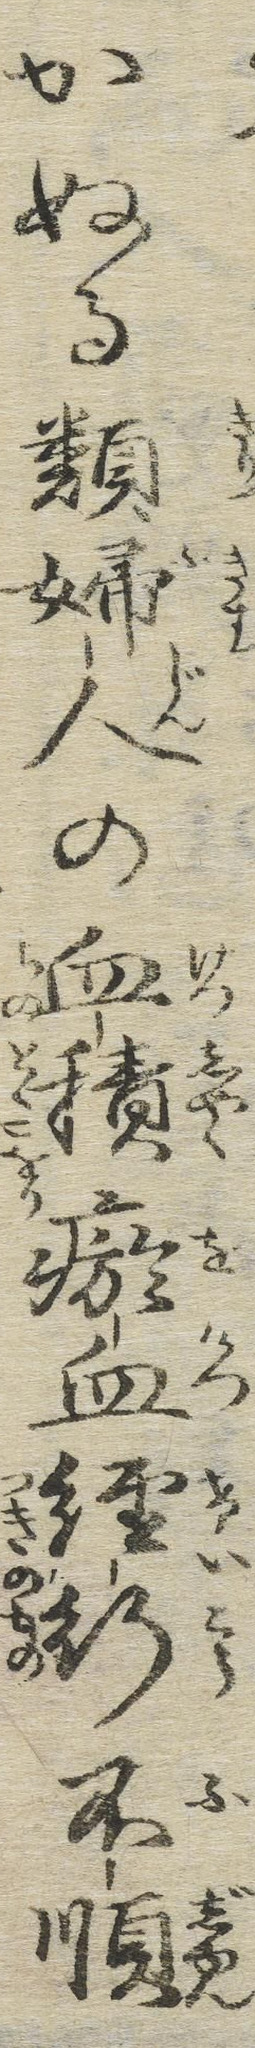かぬる類婦人の血積瘀血経行不順
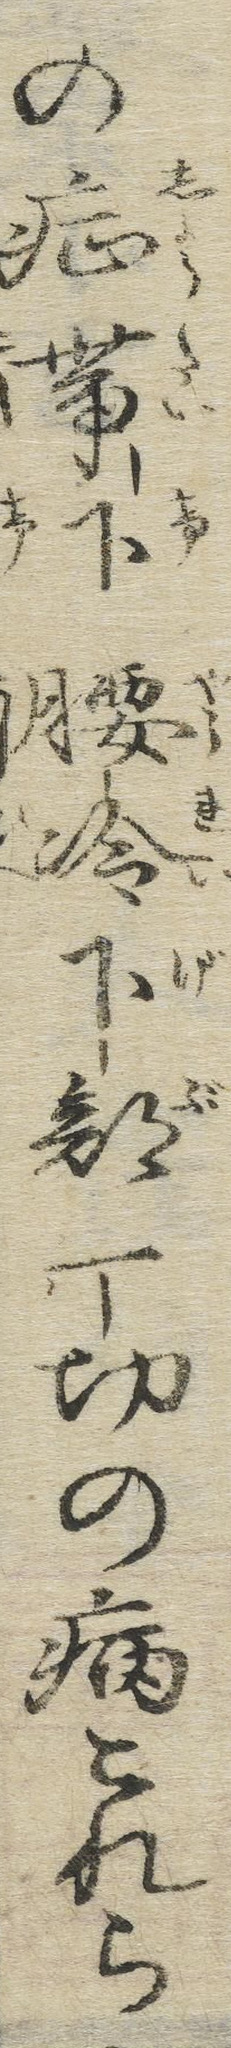の症帯下腰冷下部一切の病これら
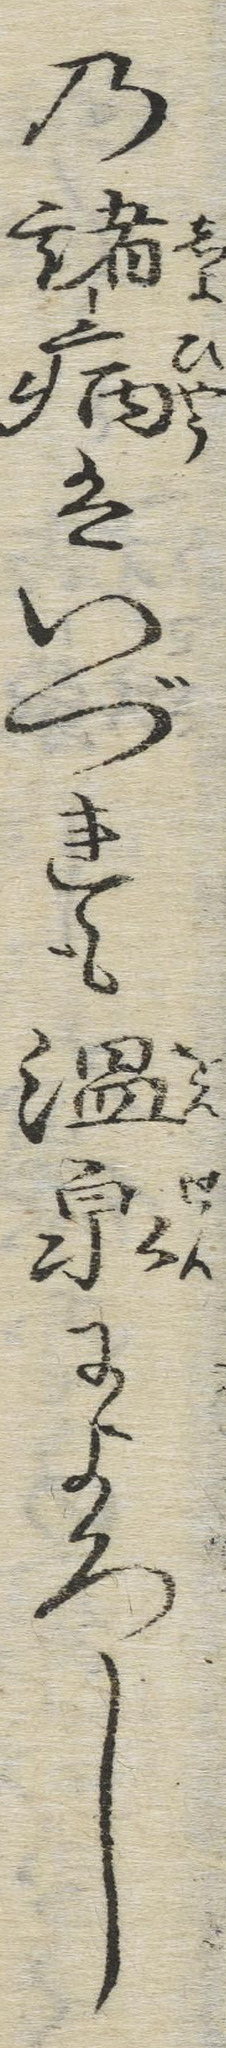の諸病はいづれも温泉によろし
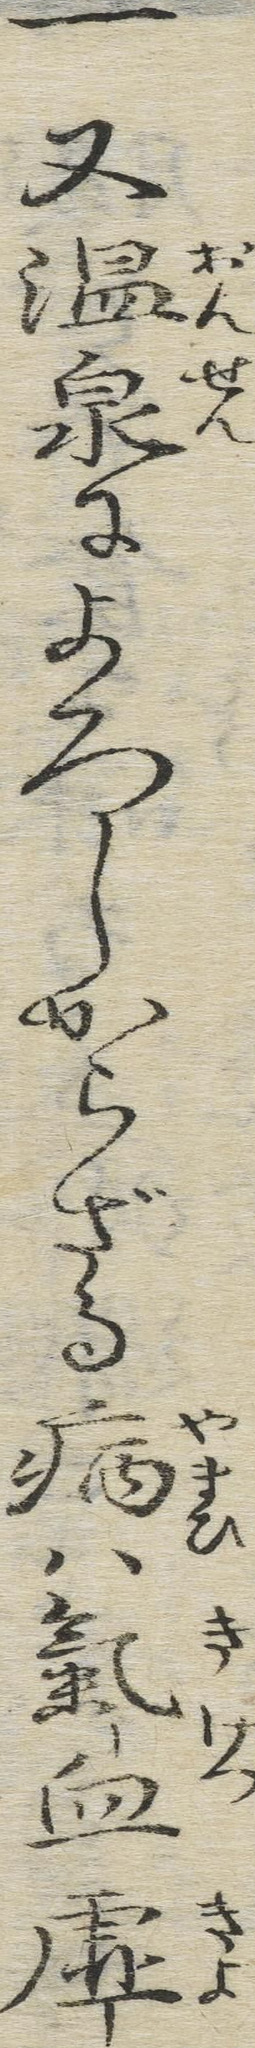一又温泉によろしからざる病は気血虚
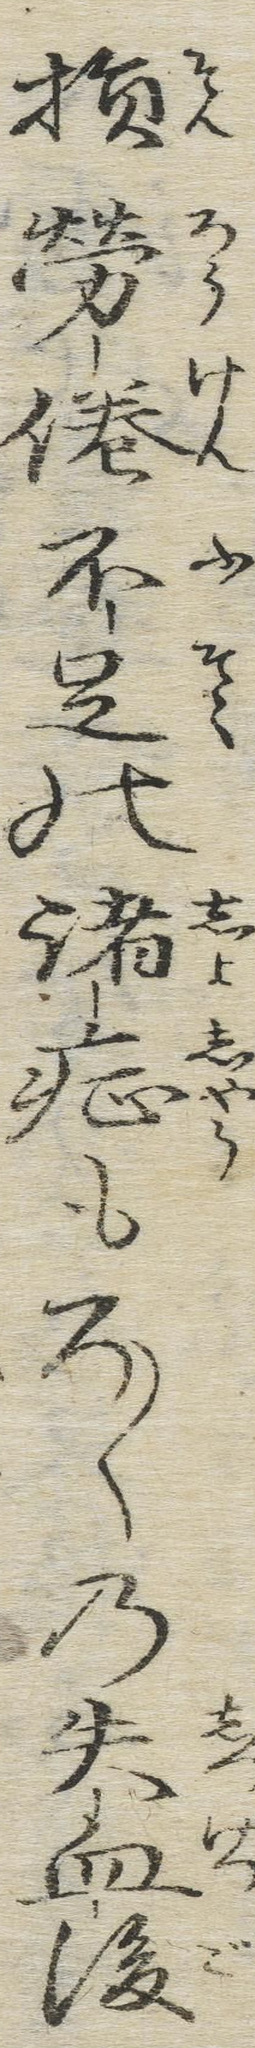損労倦不足の諸症もろ〳〵の失血後
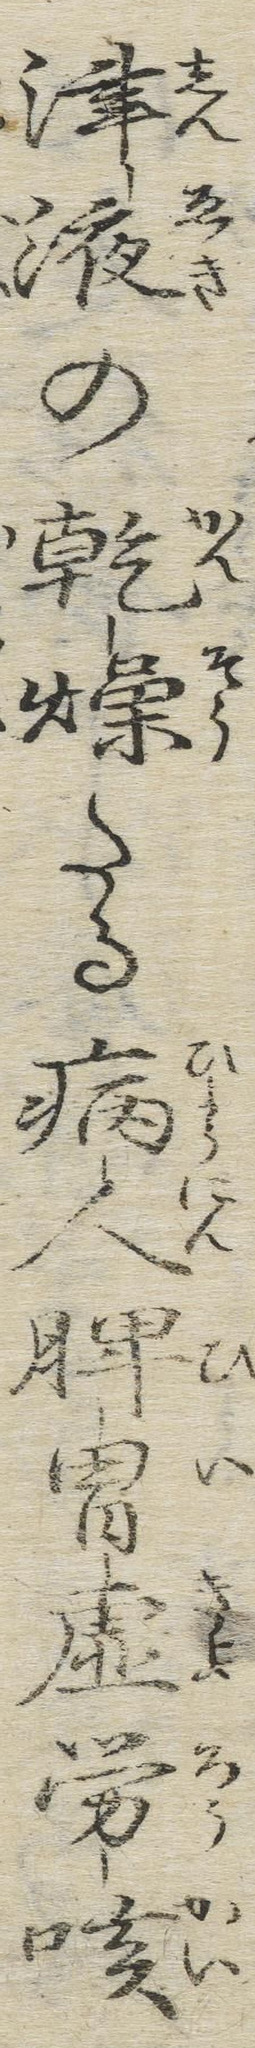津液の乾燥たる病人脾胃虚労咳
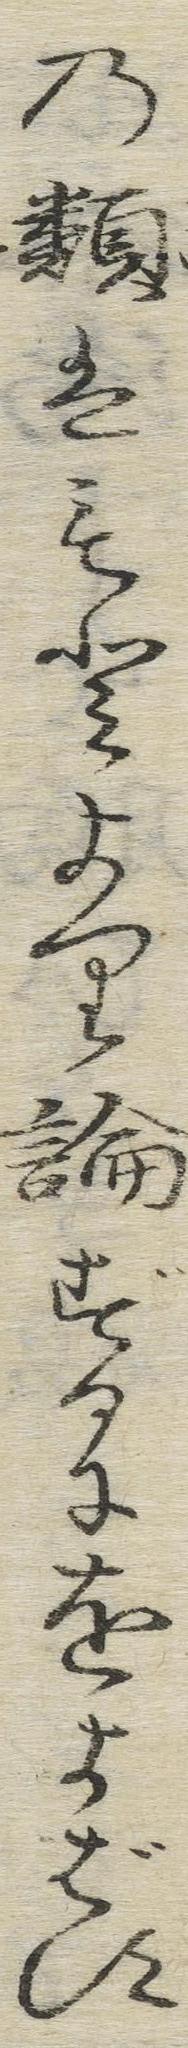の類はもとより論ずるをよばす
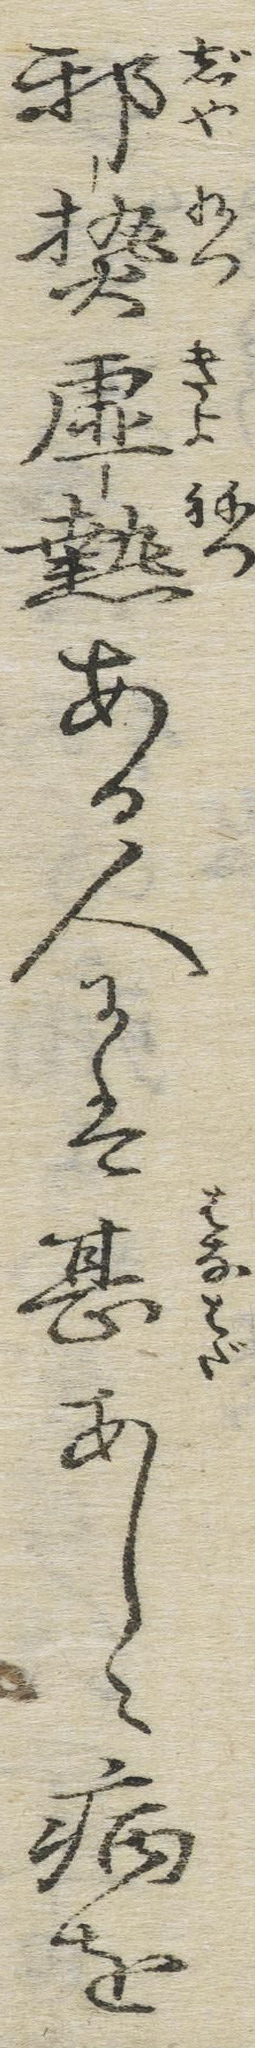邪熱虚熱ある人には甚あしく病を
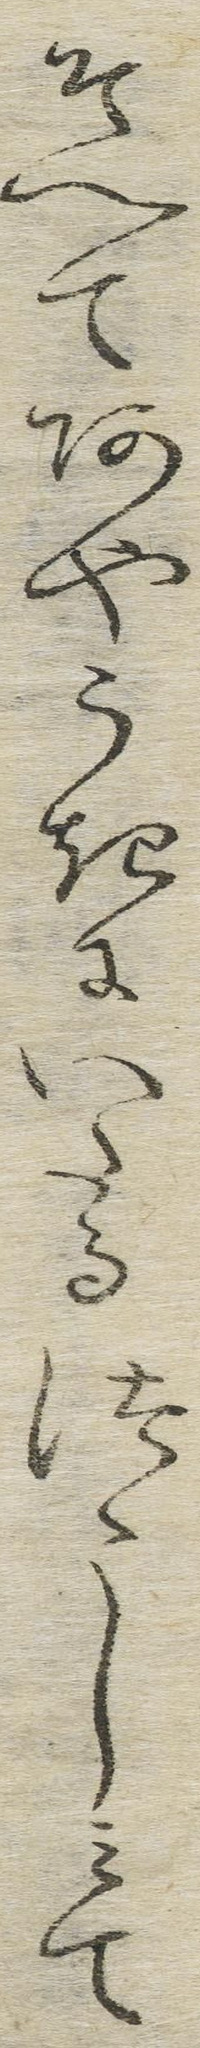そへてあやうきにいたるつゝしみて
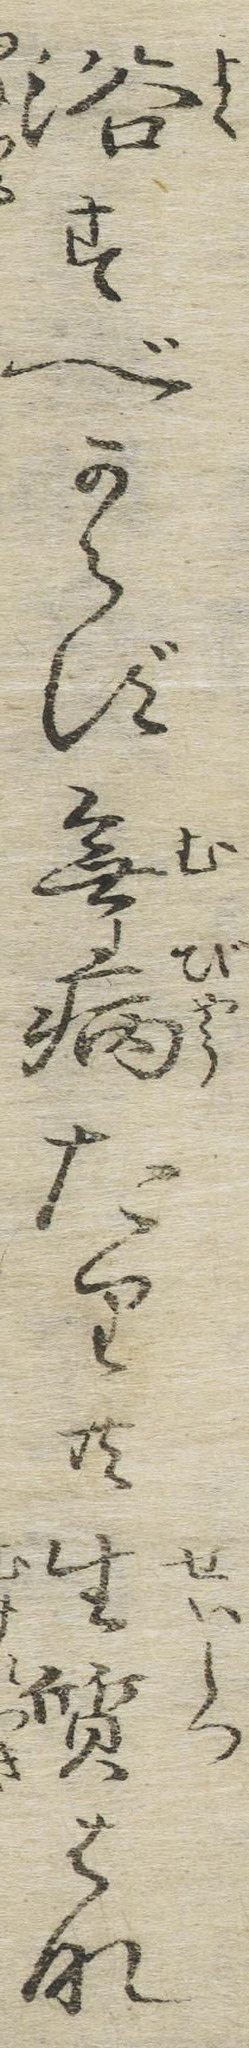浴すべからず無病たり共生質はな

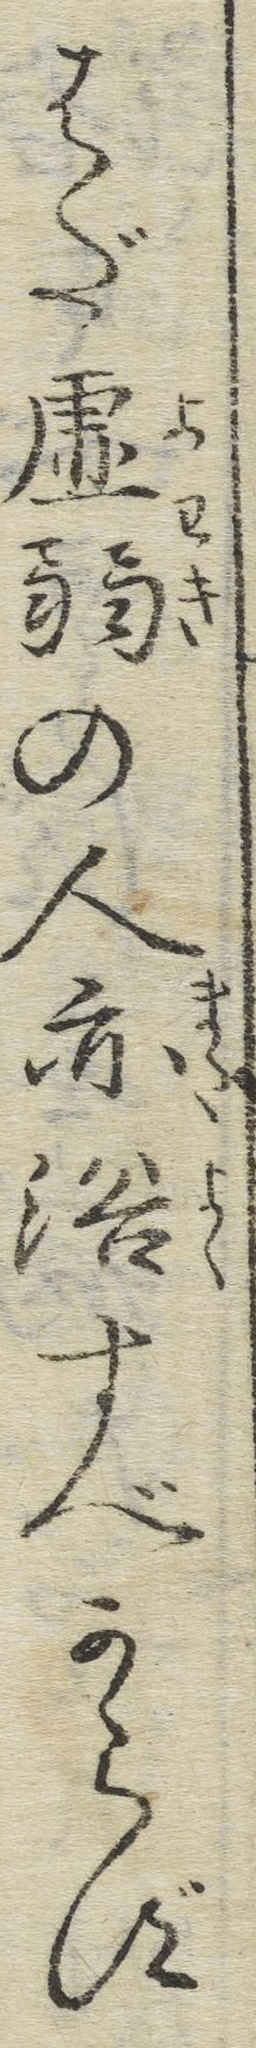はだ虚弱の人亦浴すべからず
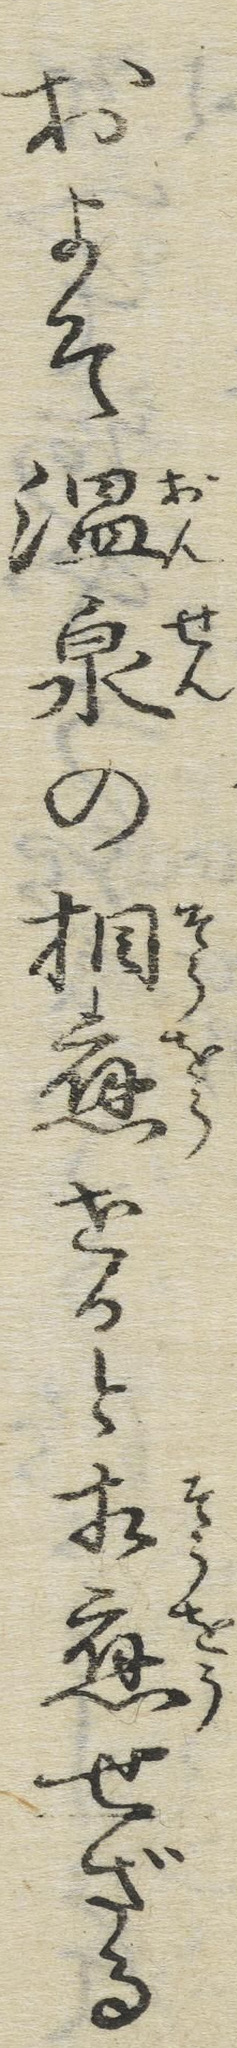一およそ温泉の相応せると相応せざる
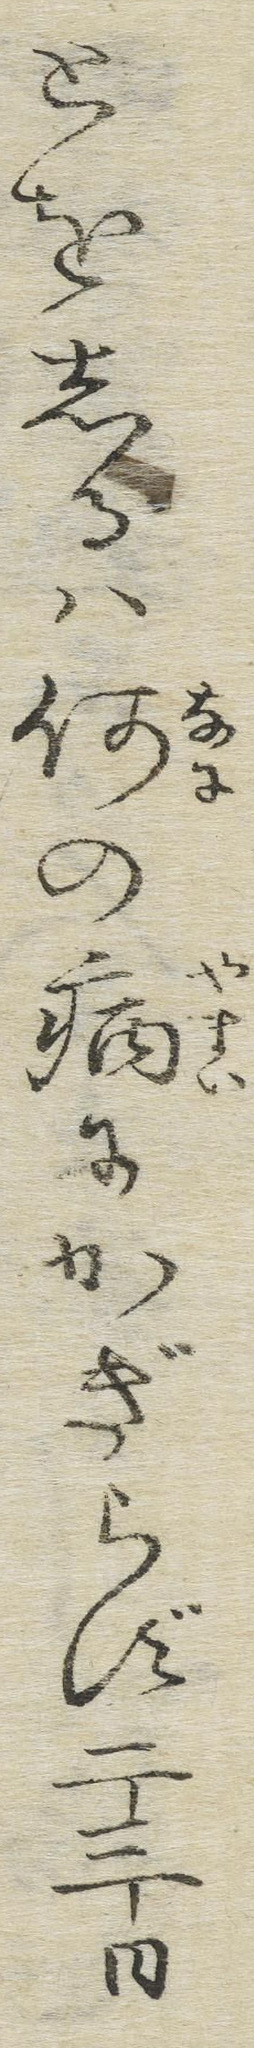とをしるは何の病にかぎらず二三日
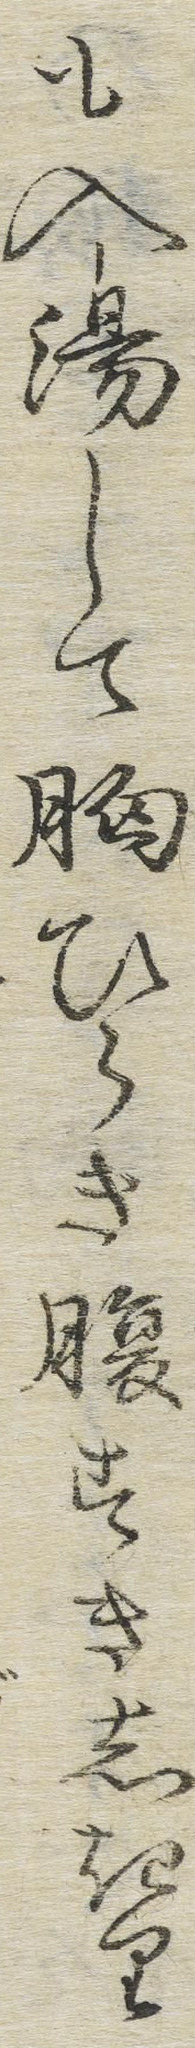も入湯して胸ひらき腹すきしきり
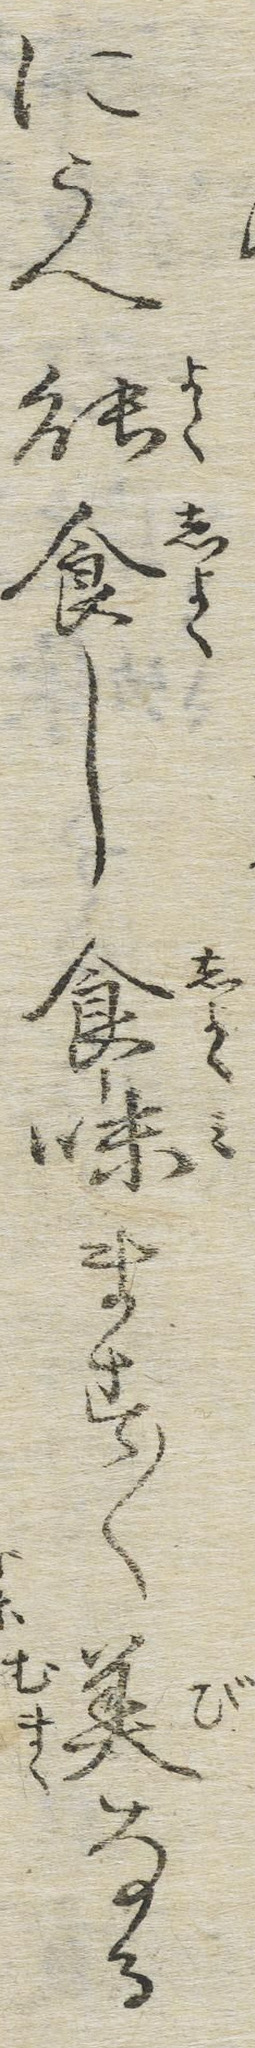にうへ能食し食味ます〳〵美なる
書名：温泉考
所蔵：東京大学地震研究所図書室 Earthquake Research Institute Library, The University of Tokyo, JAPAN
